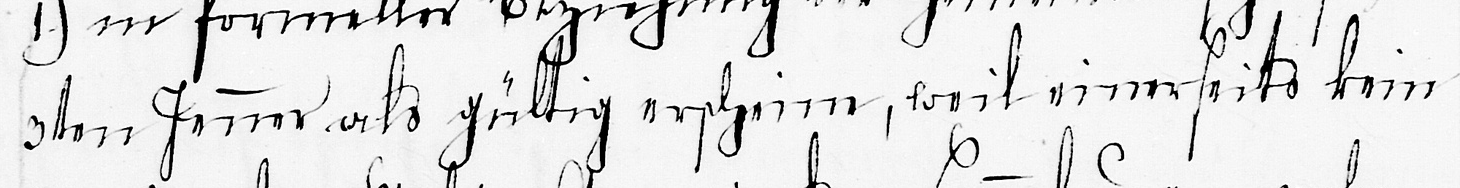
3ten Jenner als gültig erscheine, weil einerseits kein
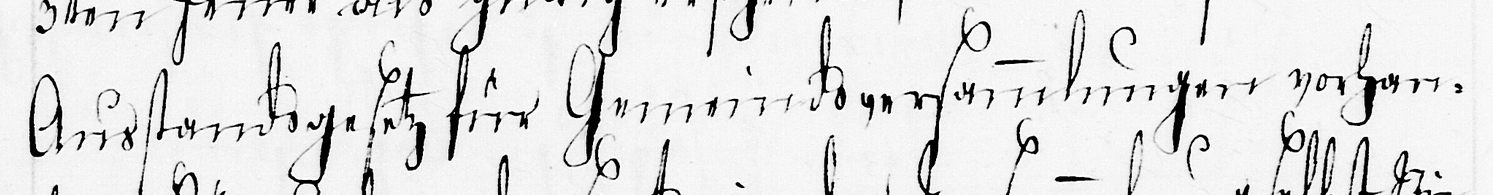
Ausstandsgesetz für Gemeindsversammlungen vorhan¬
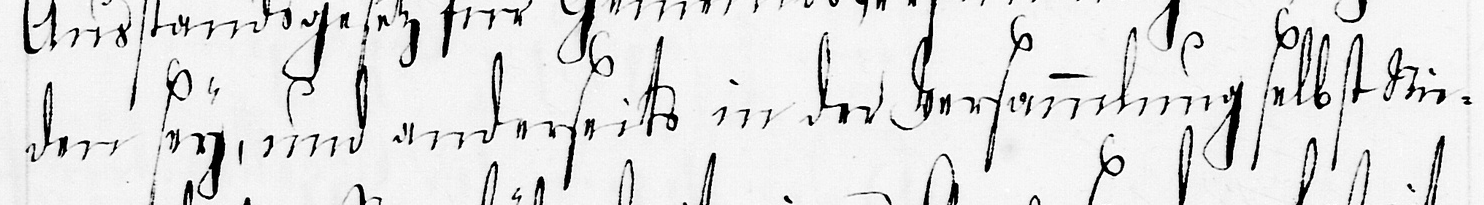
den sey, und anderseits in der Versammlung selbst Nie¬
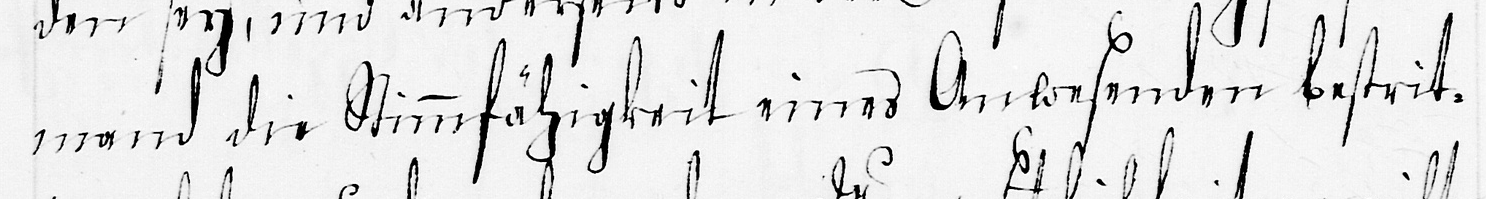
mand die Stimmfähigkeit eines Anwesenden bestrit¬
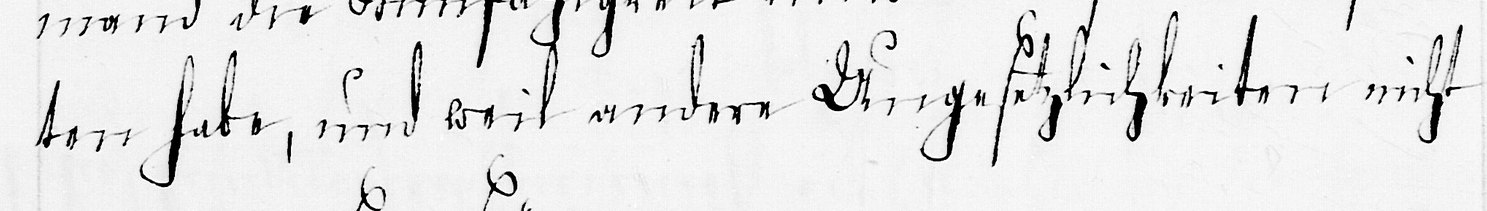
ten habe, und weil andere Ungesetzlichkeiten nicht
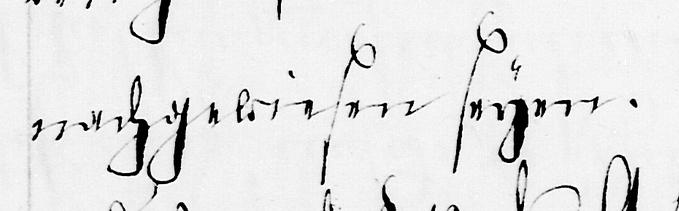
nachgewiesen seyen.
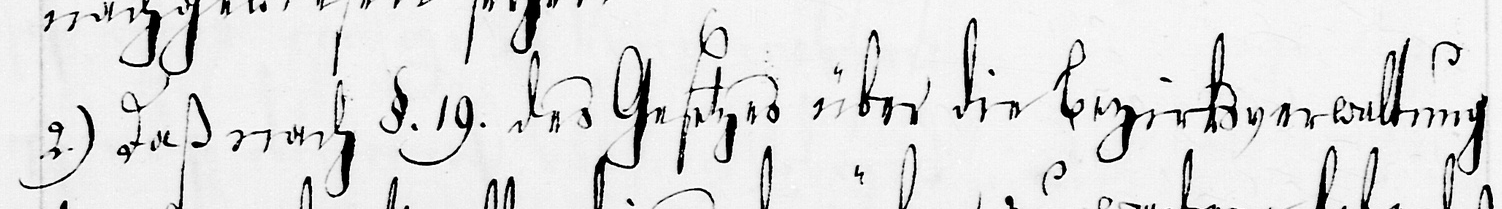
2.) Daß nach §. 19. des Gesetzes über die Bezirksverwaltung
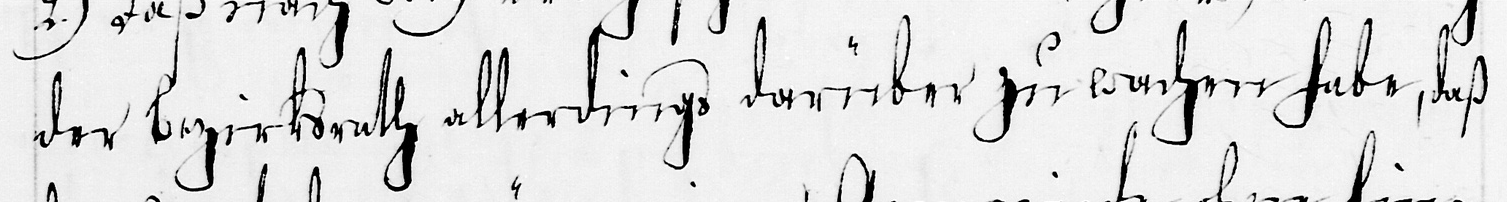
der Bezirksrath allerdings darüber zu wachen habe, daß
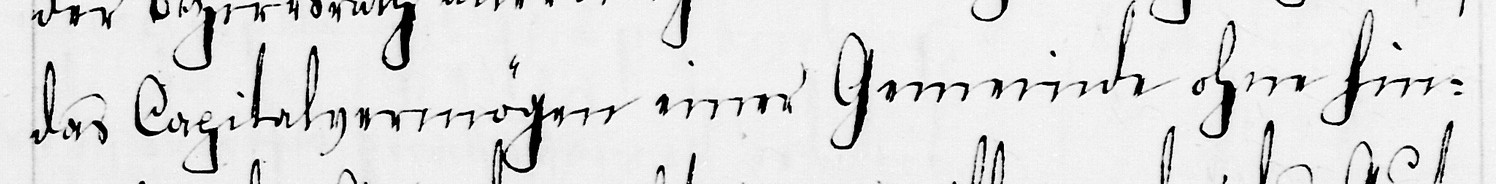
das Capitalvermögen einer Gemeinde ohne hin¬
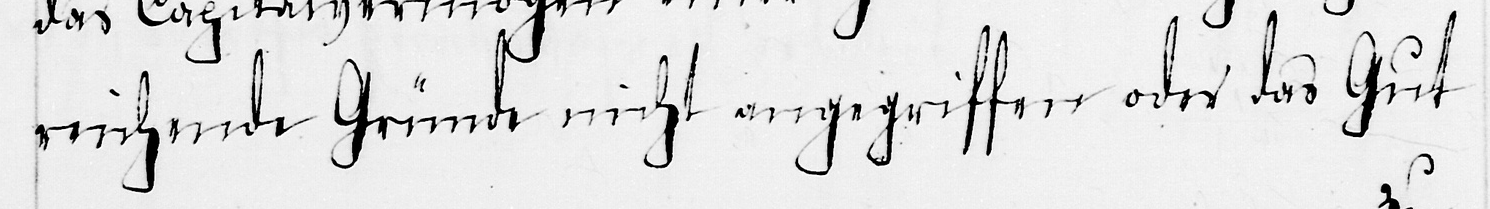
reichende Gründe nicht angegriffen oder das Gut
